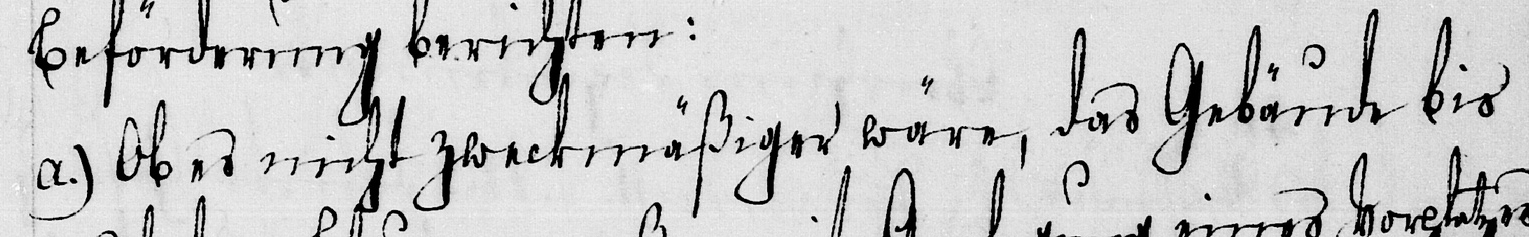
a.) Ob es nicht zweckmäßiger wäre, das Gebäude bis
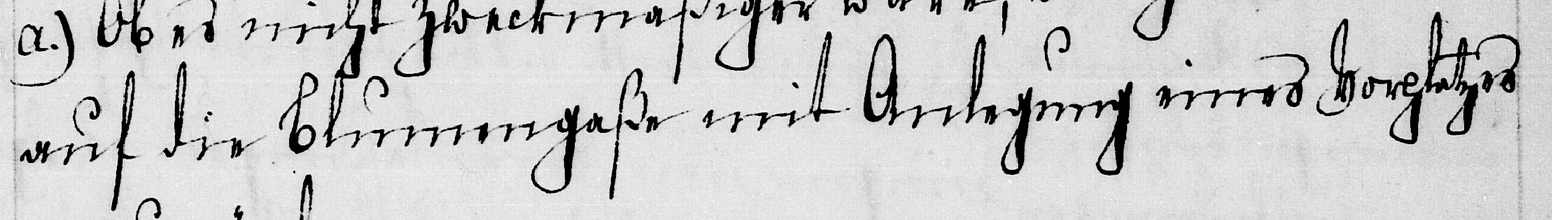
auf die Blumengaße mit Anlegung eines Vorplatzes
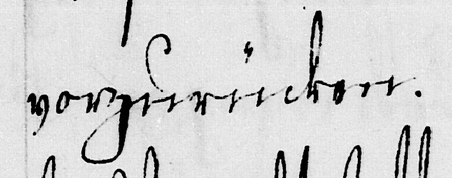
vorzurücken.
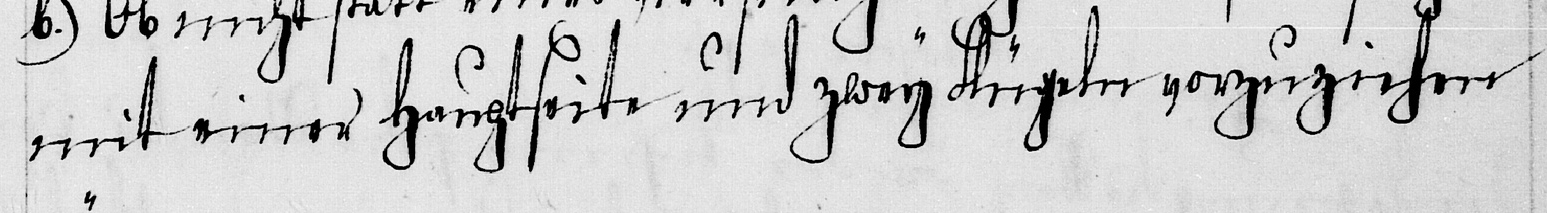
mit einer Hauptseite und zwey Flügeln vorzuziehen
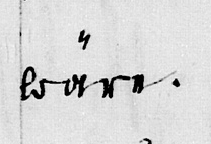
wäre.
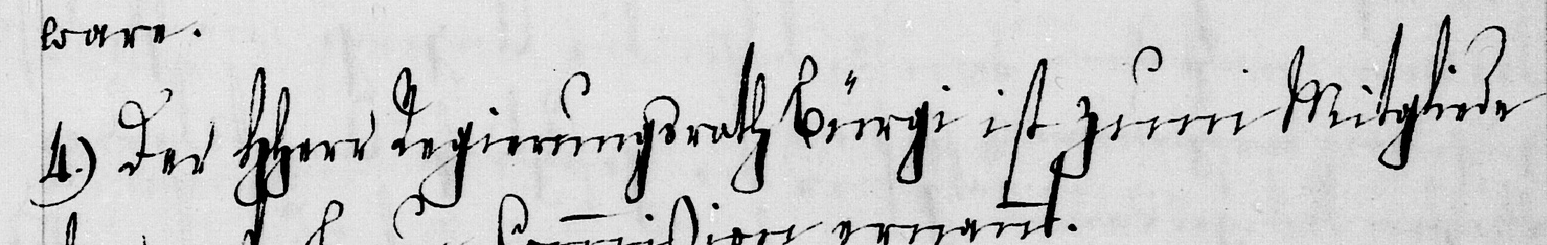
4.) Der HHerr Regierungsrath Bürgi ist zum Mitgliede
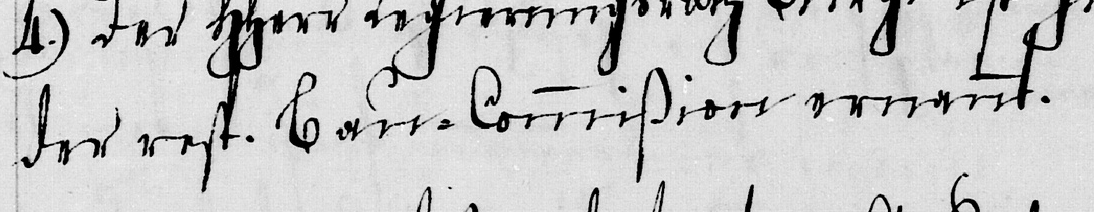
der resp. Bau-Commißion ernannt.
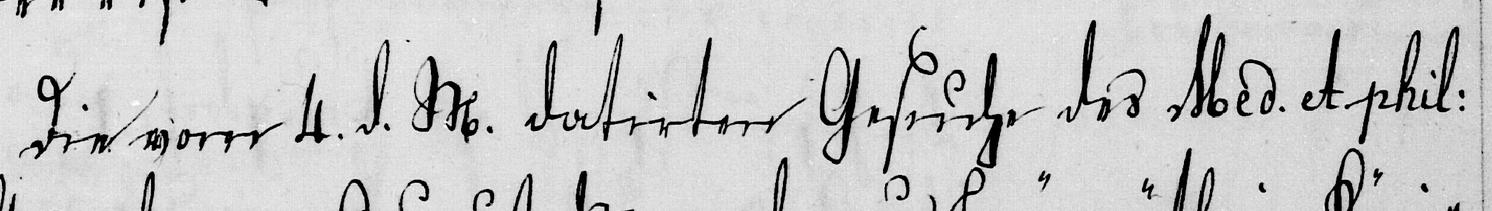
Die vom 4. d. M. datirten Gesuche des Med. et phil:
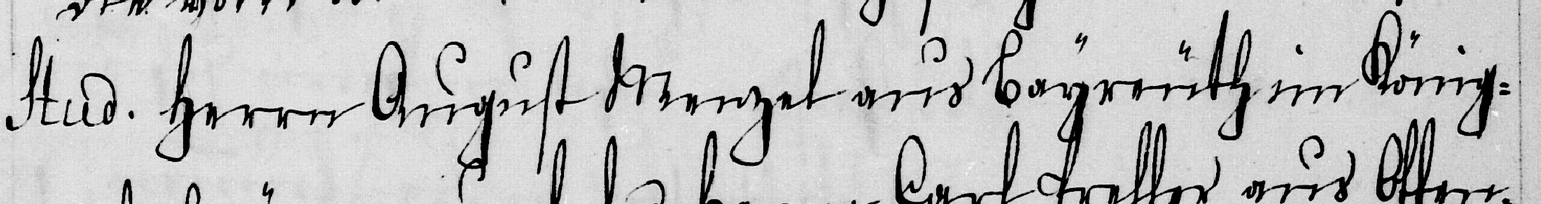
Stud. Herrn August Menzel aus Bayreuth im König¬
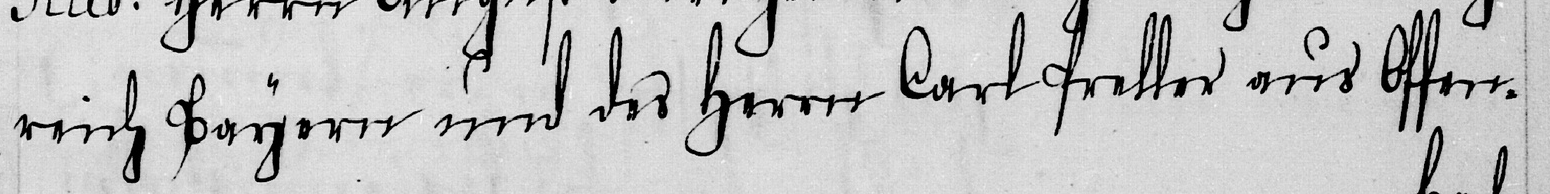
reich Bayern und des Herrn Carl Preller aus Offen-
